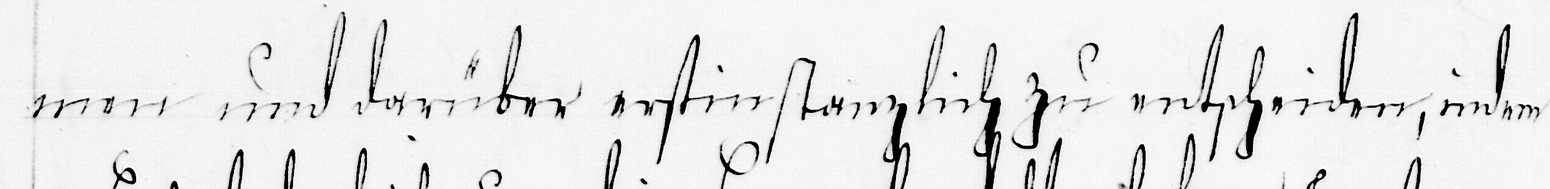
men und darüber erstinstanzlich zu entscheiden, indem
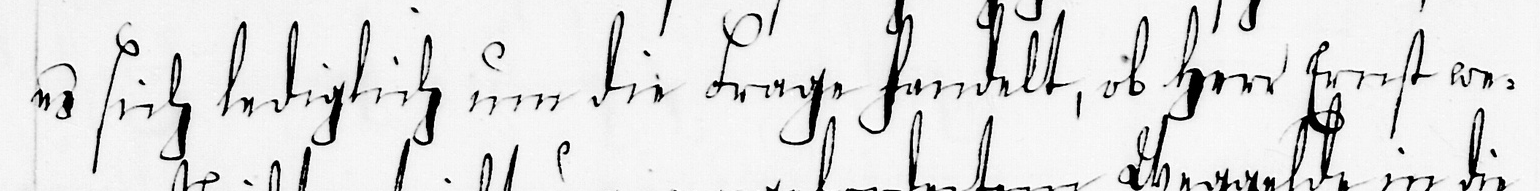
es sich lediglich um die Frage handelt, ob Herr Ernst we¬
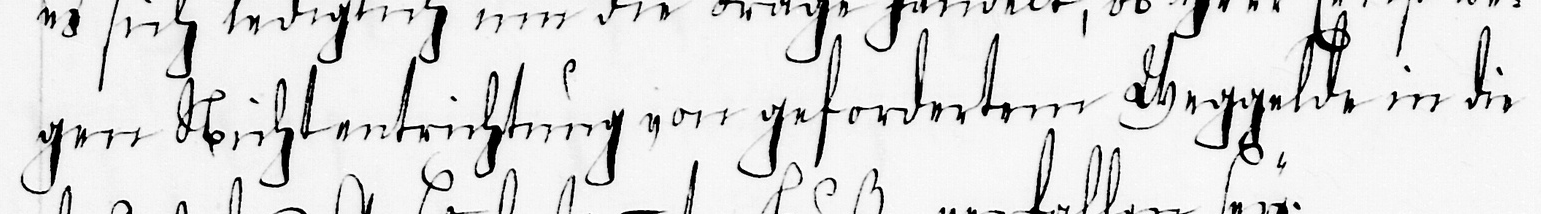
gen Nichtentrichtung von gefordertem Weggelde in die
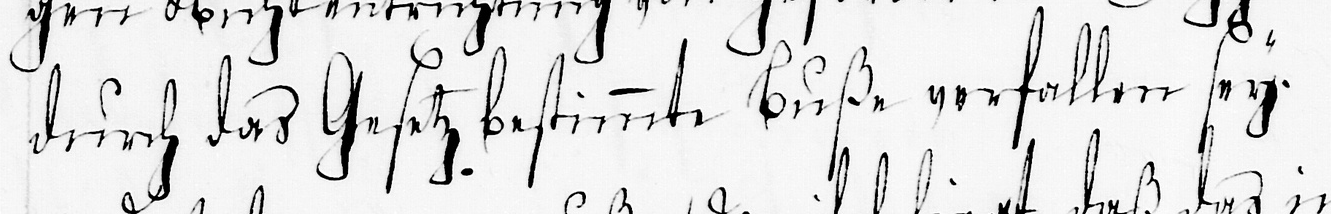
durch das Gesetz bestimmte Buße verfallen sey.
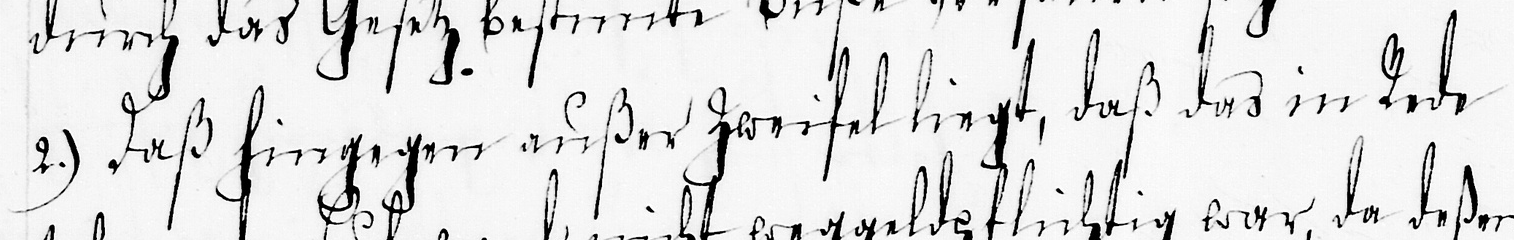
2.) Daß hingegen außer Zweifel liegt, daß das in Rede
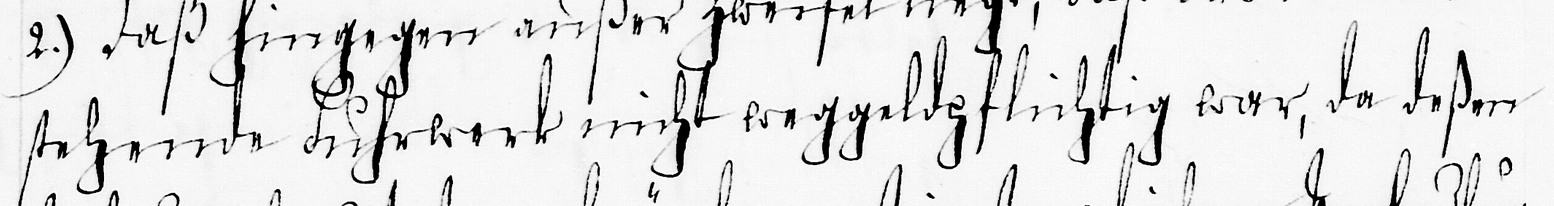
stehende Fuhrwerk nicht weggeldpflichtig war, da deßen
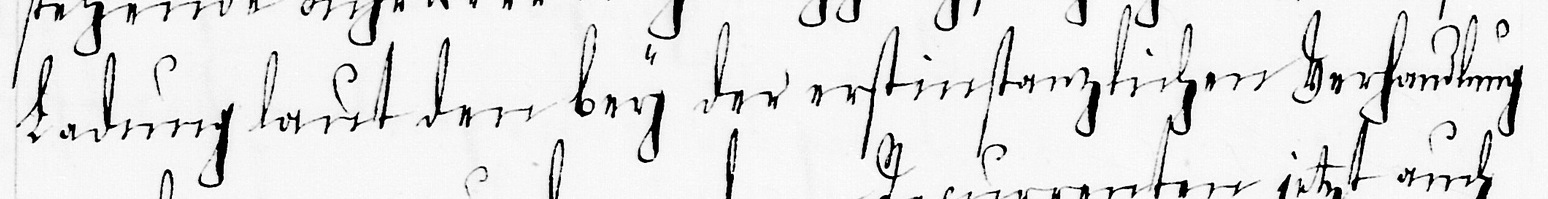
Ladung laut den bey der erstinstanzlichen Verhandlung
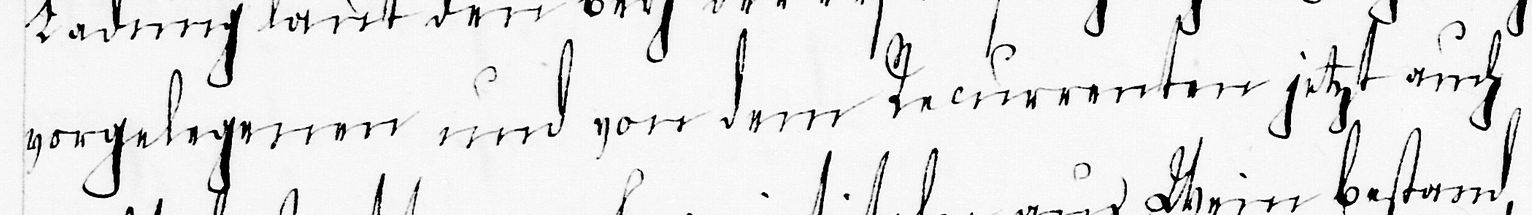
vorgelegenen und von dem Recurrenten jetzt auch
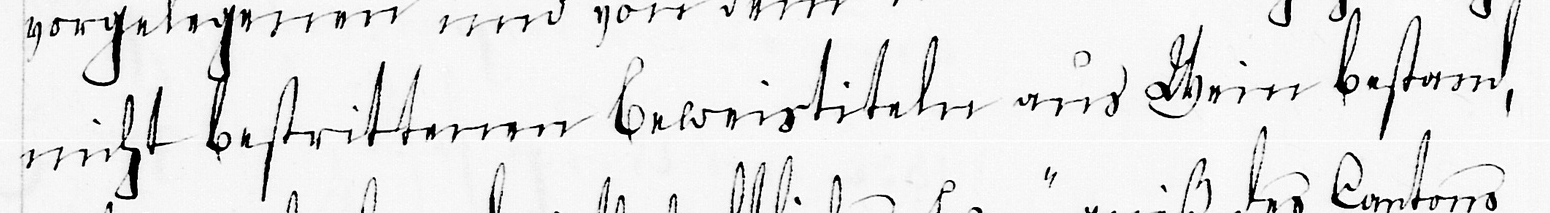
nicht bestrittenen Beweistiteln aus Wein bestand,
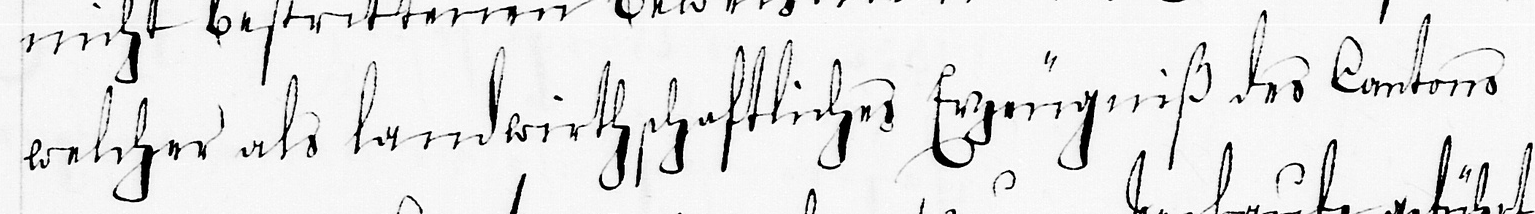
welcher als landwirthschaftliches Erzeugniß des Cantons
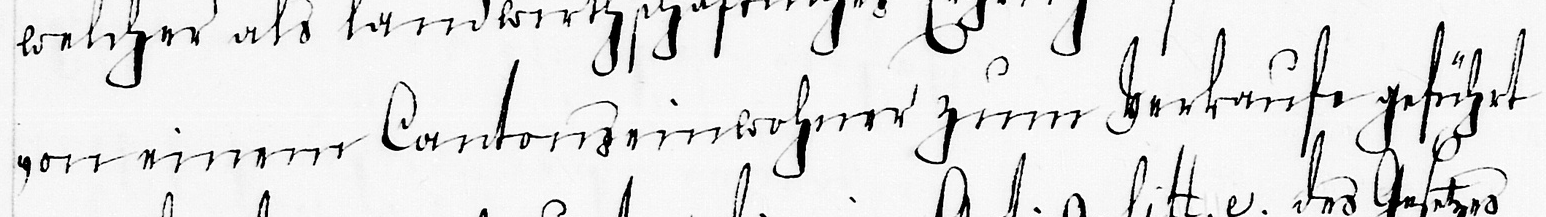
von einem Cantonseinwohner zum Verkaufe geführt
